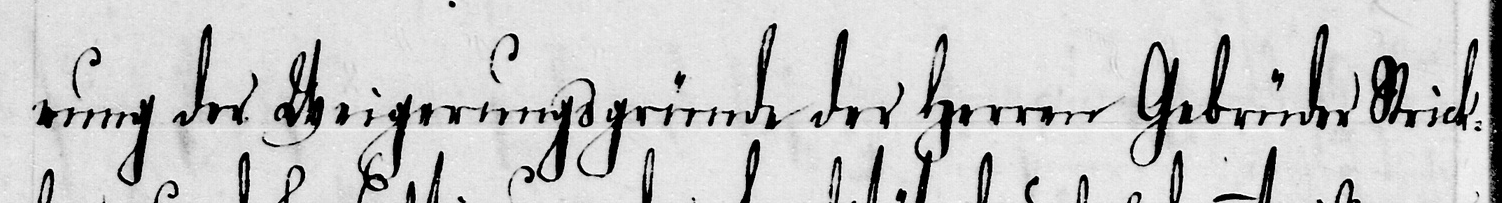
rung der Weigerungsgründe der Herren Gebrüder Stric¬
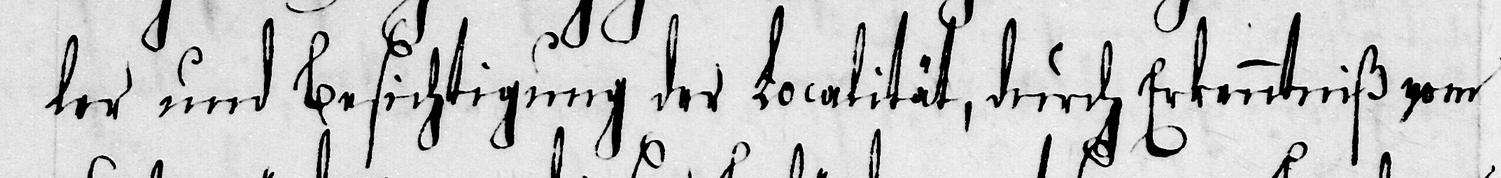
kler und Besichtigung der Localität, durch Erkenntniß vom
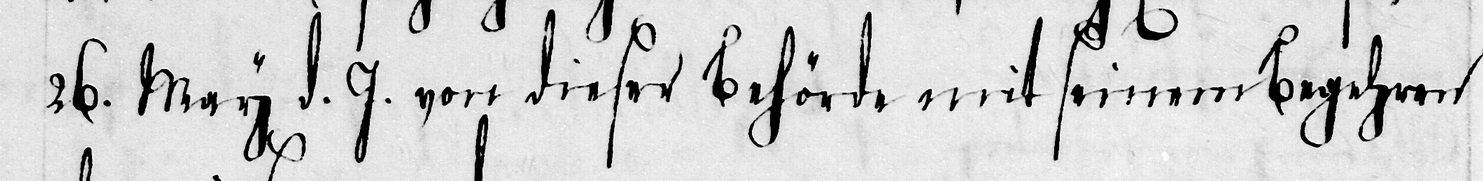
26. May d. J. von dieser Behörde mit seinem Begehren
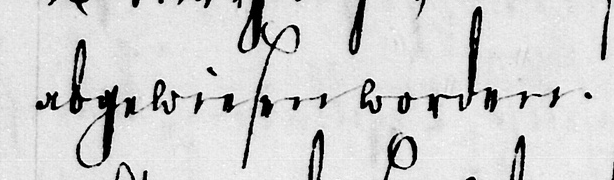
abgewiesen worden.
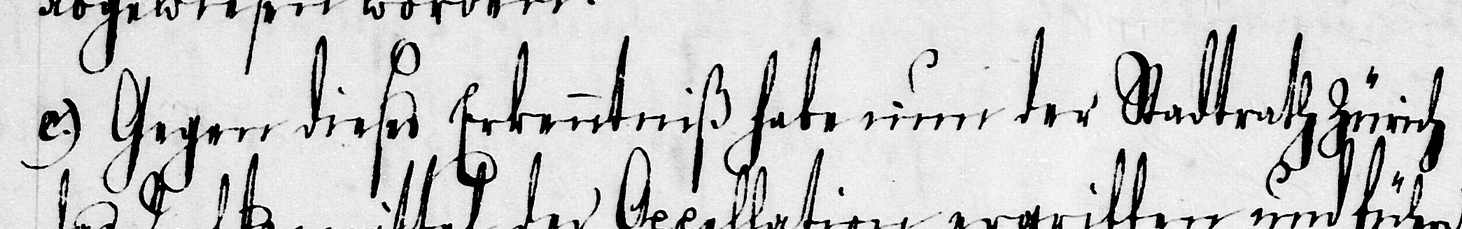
c.) Gegen dieses Erkenntniß habe nun der Stadtrath Züri¬
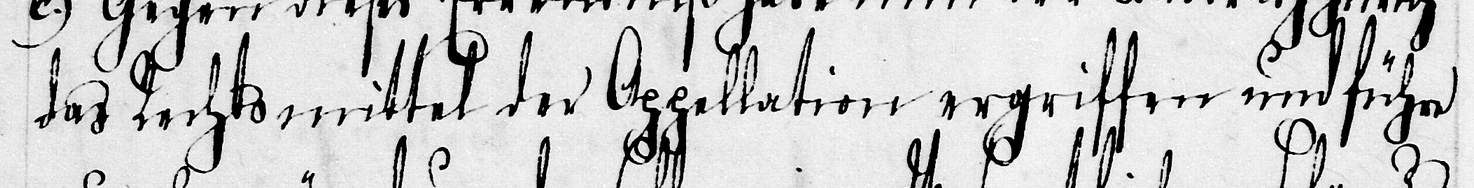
das Rechtsmittel der Appellation ergriffen und führe
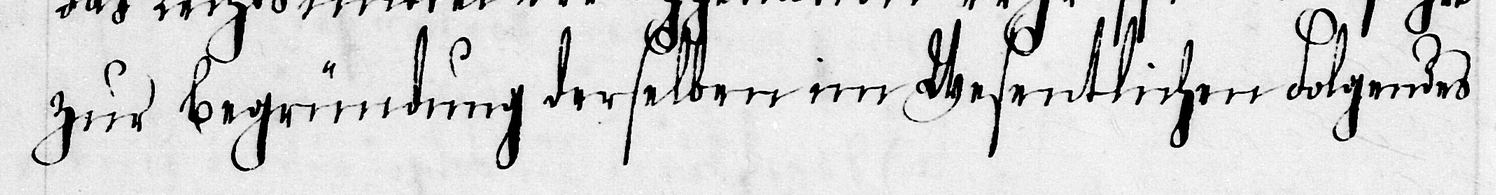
zur Begründung derselben im Wesentlichen Folgendes
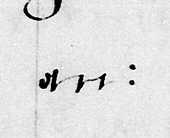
an¬
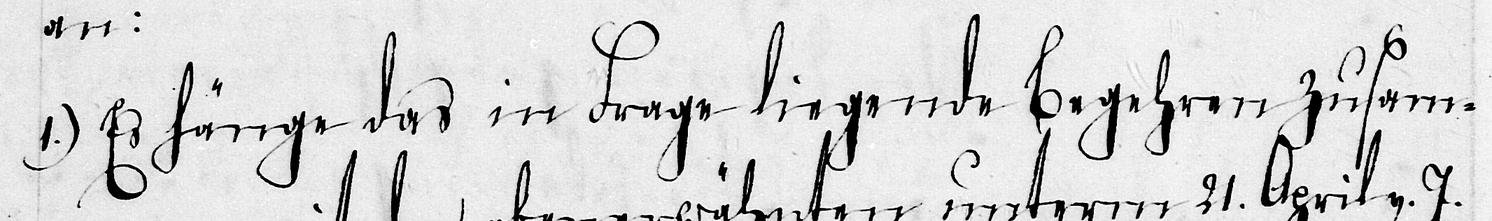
1.) Es hänge das in Frage liegende Begehren zusam¬
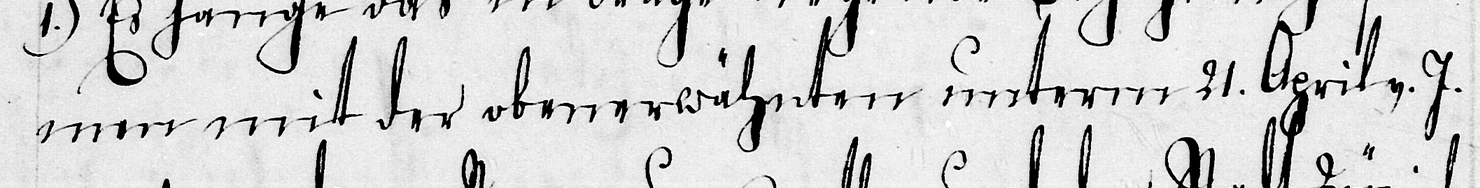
men mit der obenerwähnten unterm 21. April v. J.
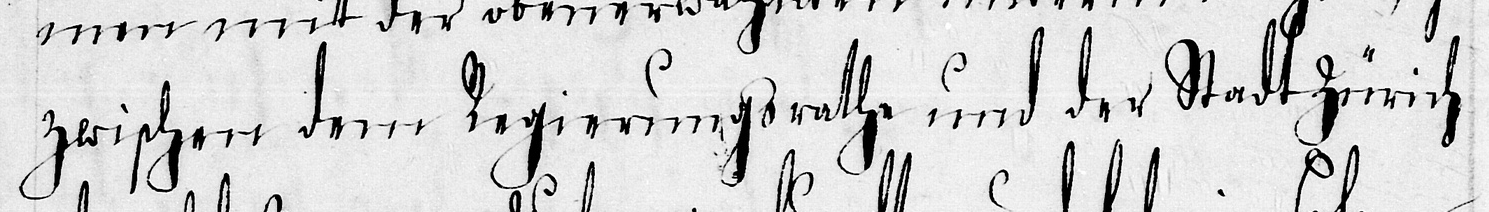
zwischen dem Regierungsrathe und der Stadt Zürich
